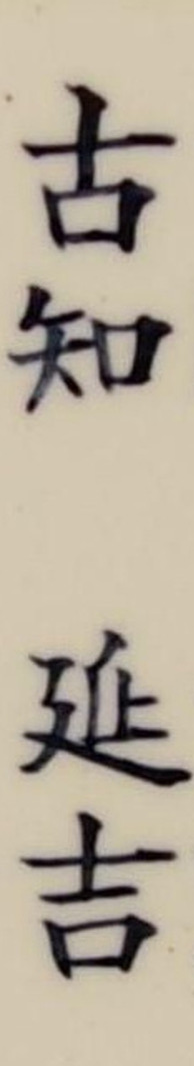古知延吉
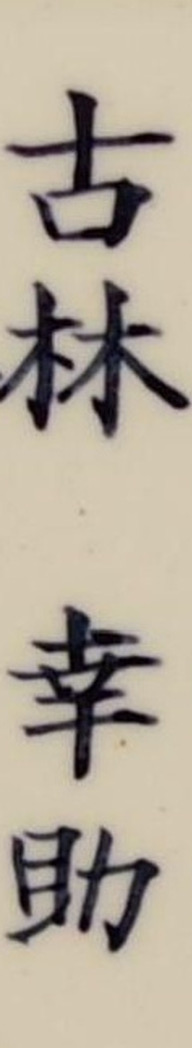古林幸助
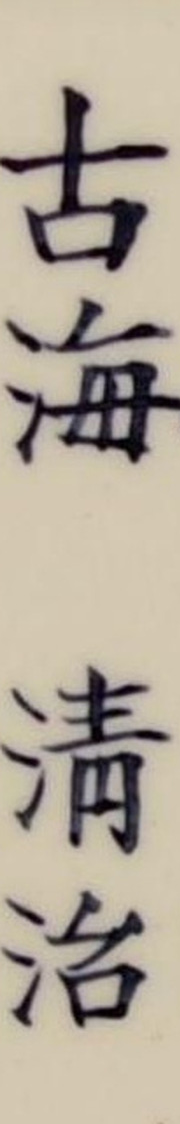古海清治
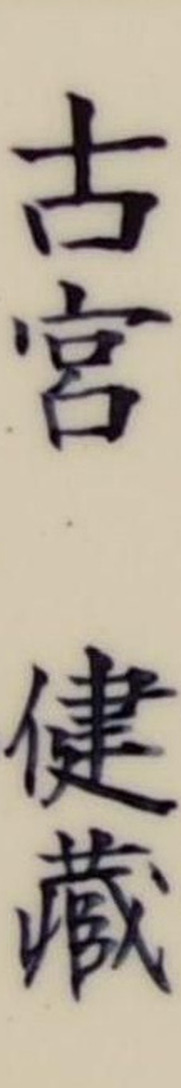古宮健蔵
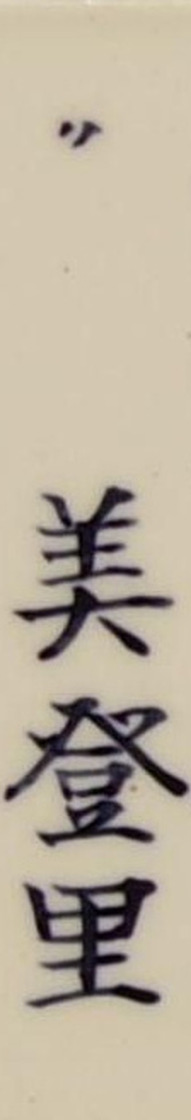美登里
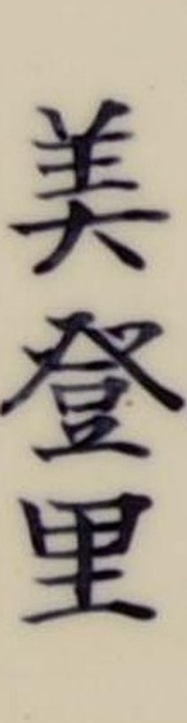美登里
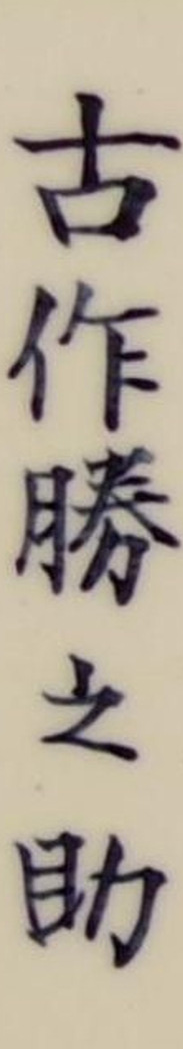古作勝之助
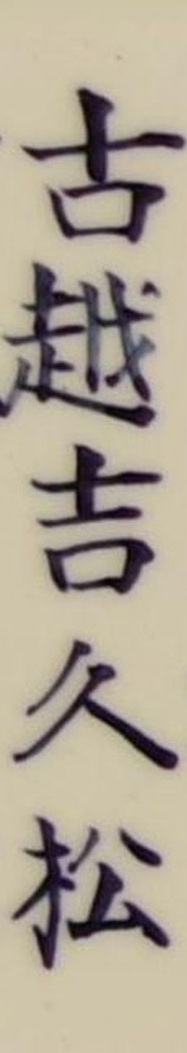古越吉久松
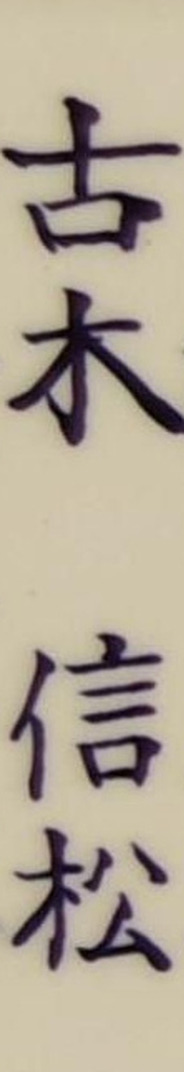古木信松
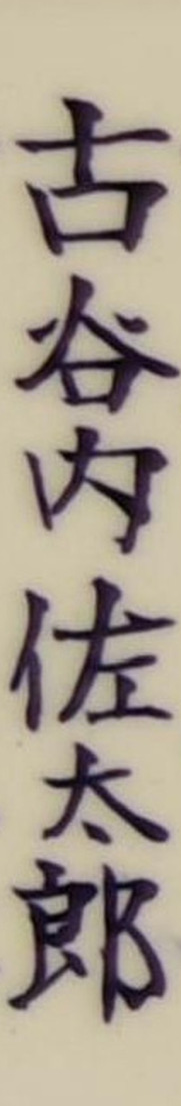古谷内佐太郎
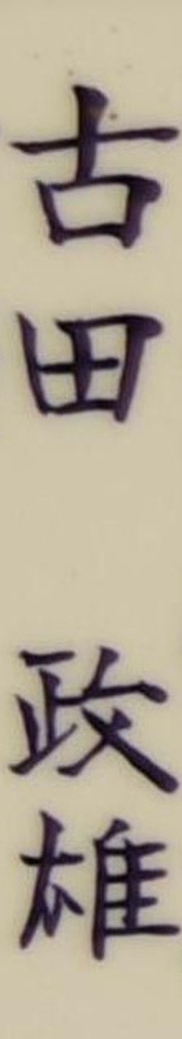古田政雄
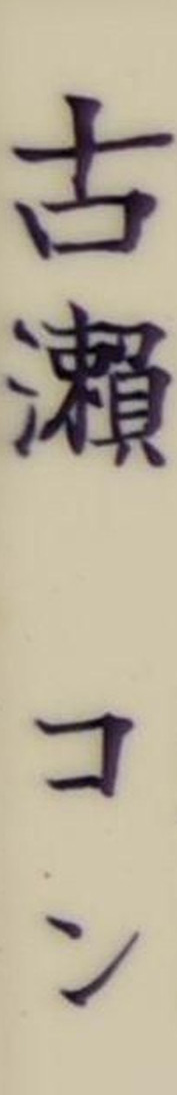古瀬コン

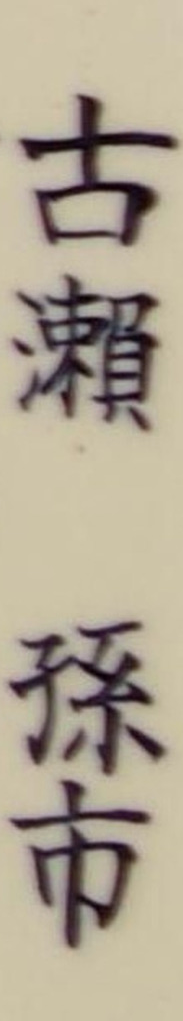古瀬孫市
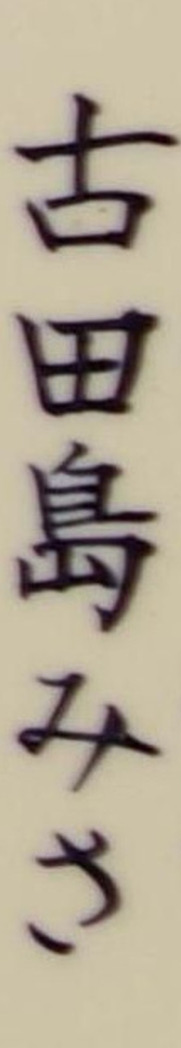古田島みさ
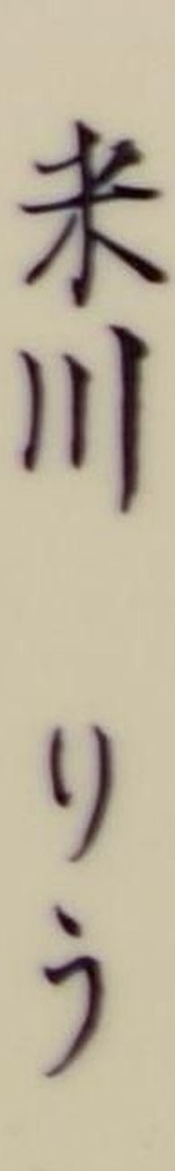米川りう
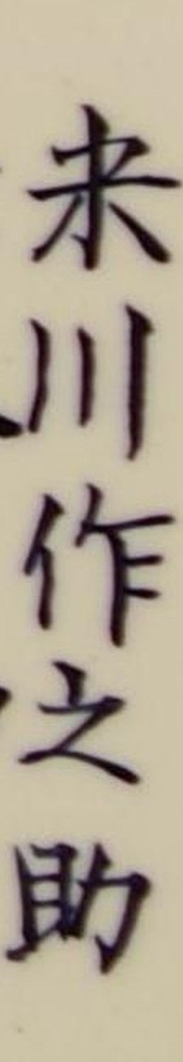米川作之助
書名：E~L
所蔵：高野山金剛峯寺
